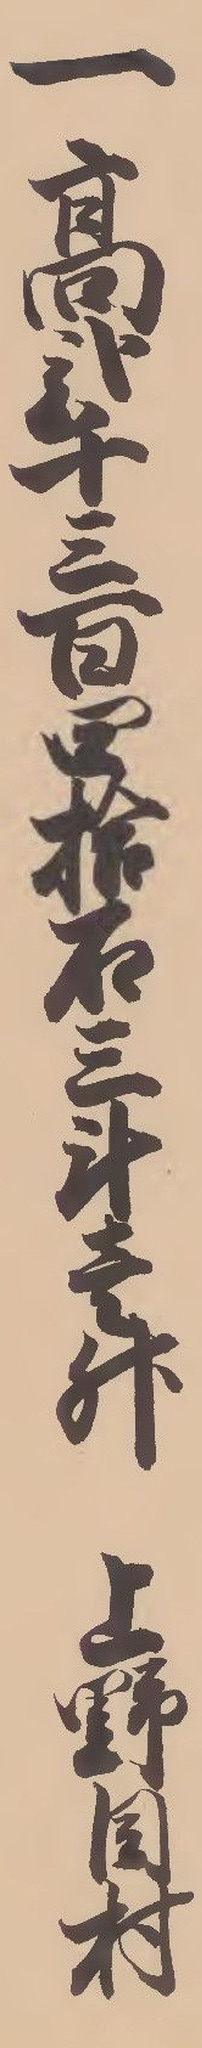一高弐千三百四拾石三斗壱升上野目村

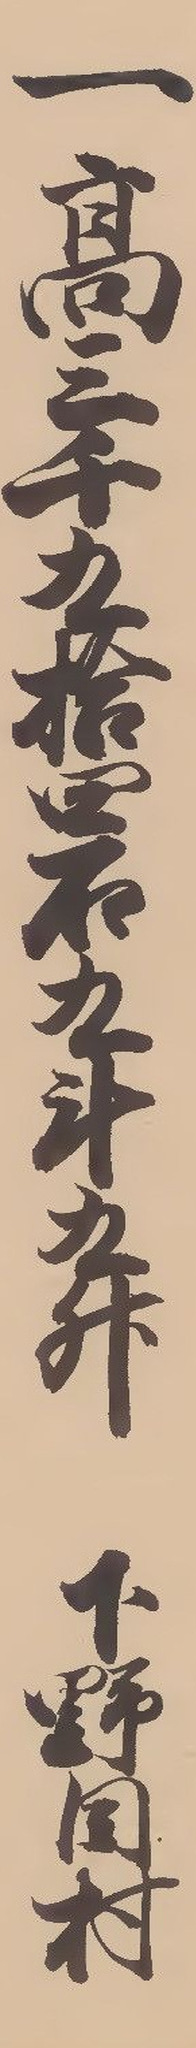一高三千九拾四石九斗九升下野目村
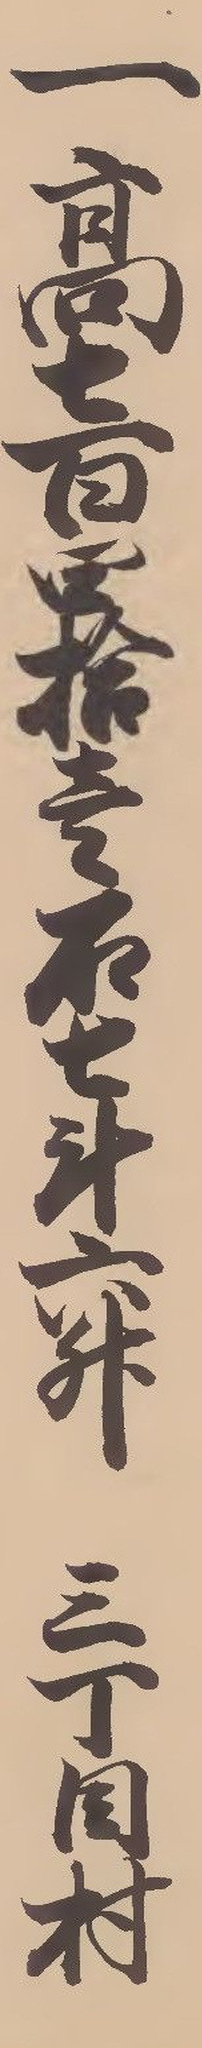一高七百四拾壱石七斗六升三丁目村
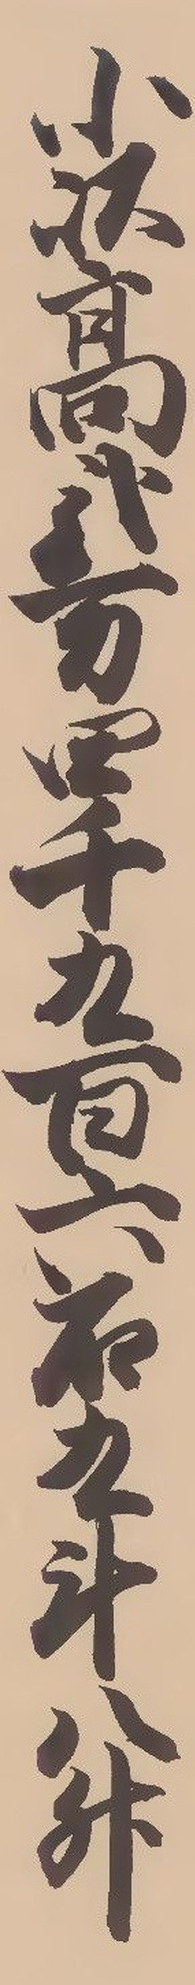小以高弐万四千九百六石九斗八升
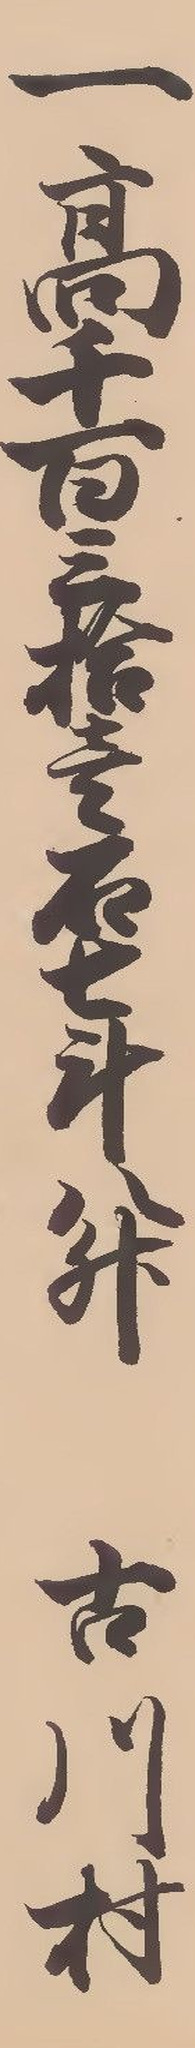一高千百三拾壱石七斗八升古川村
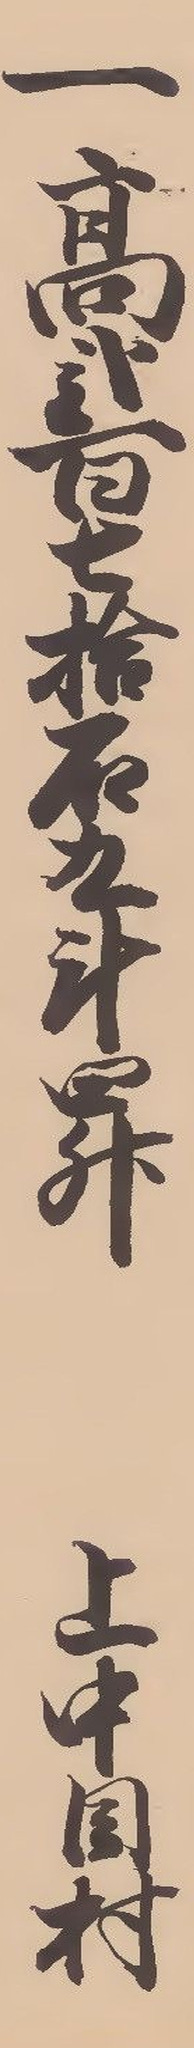一高弐百七拾石九斗四升上中目村
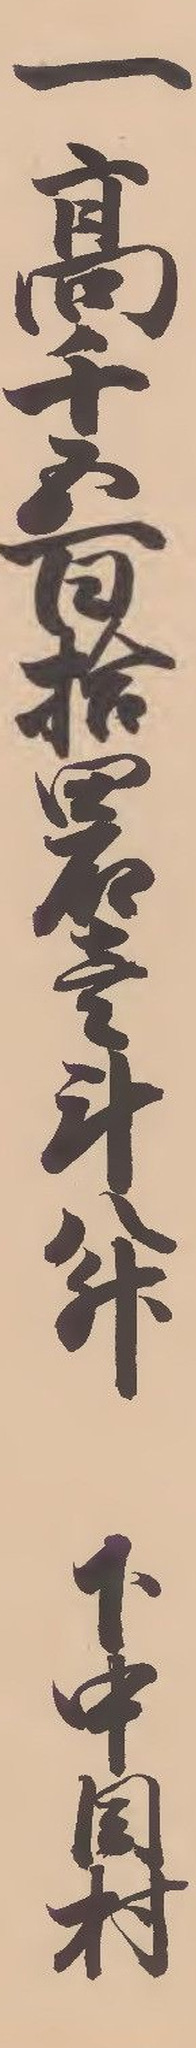一高千五百拾四石壱斗八升下中目村

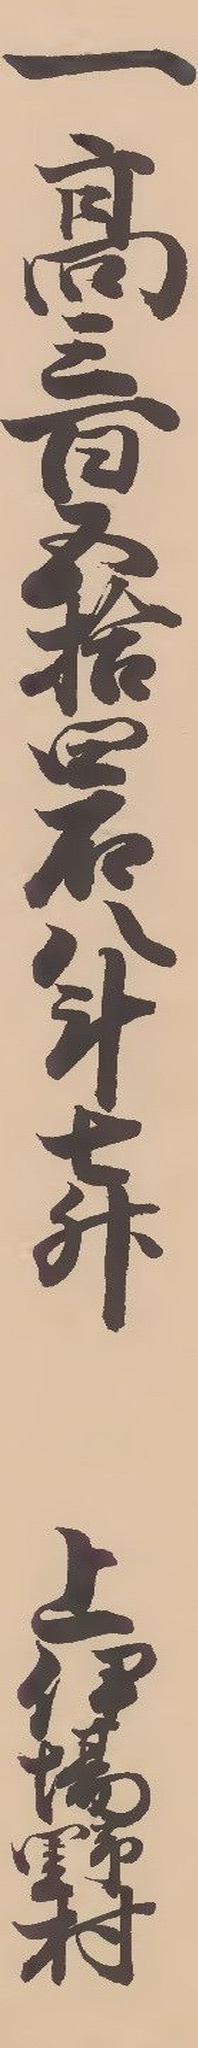一高三百五拾四石八斗七升上伊場野村
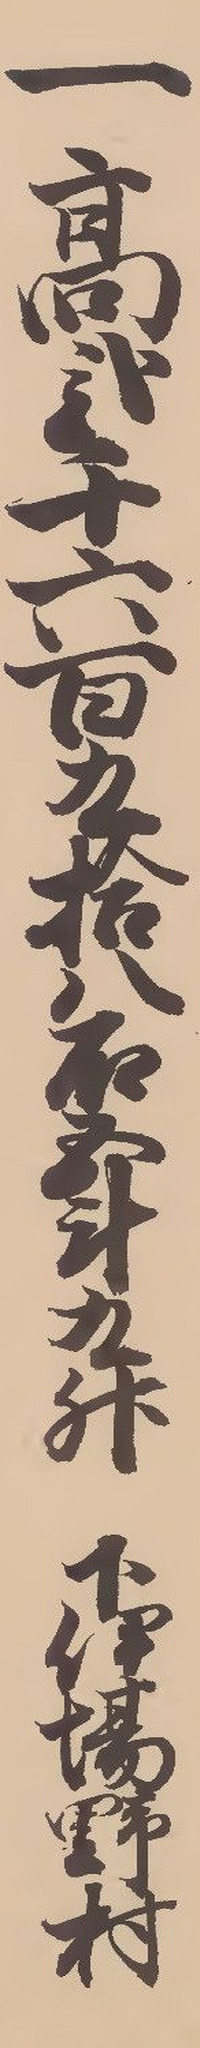一高弐千六百九拾八石五斗九升下伊場野村
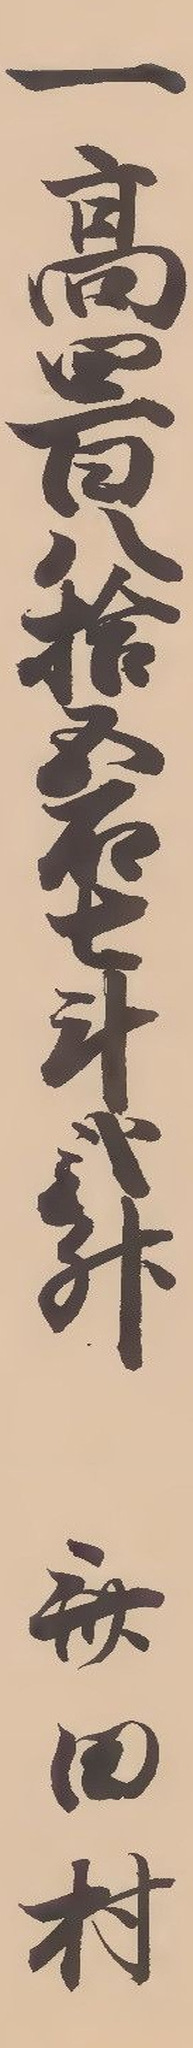一高四百八拾五石七斗弐升斎田村
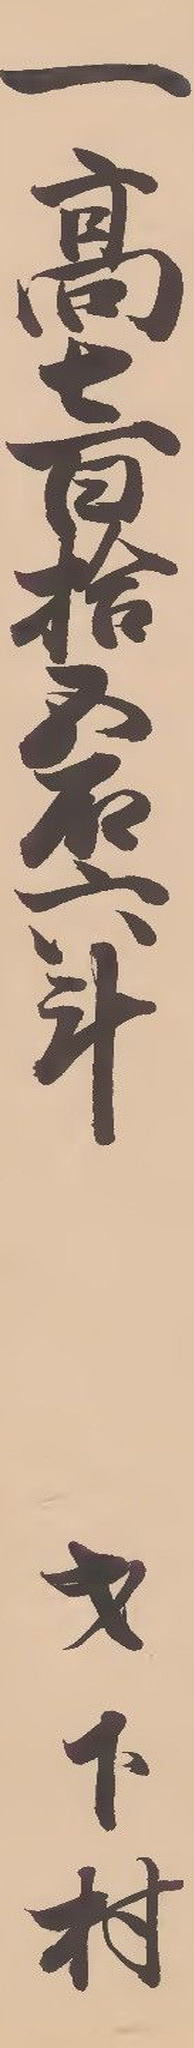一高七百拾五石六斗才下村
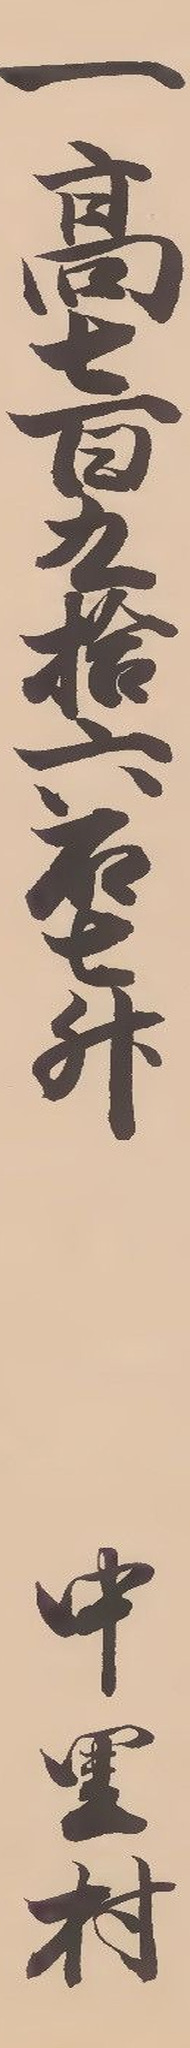一高七百九拾六石七升中里村
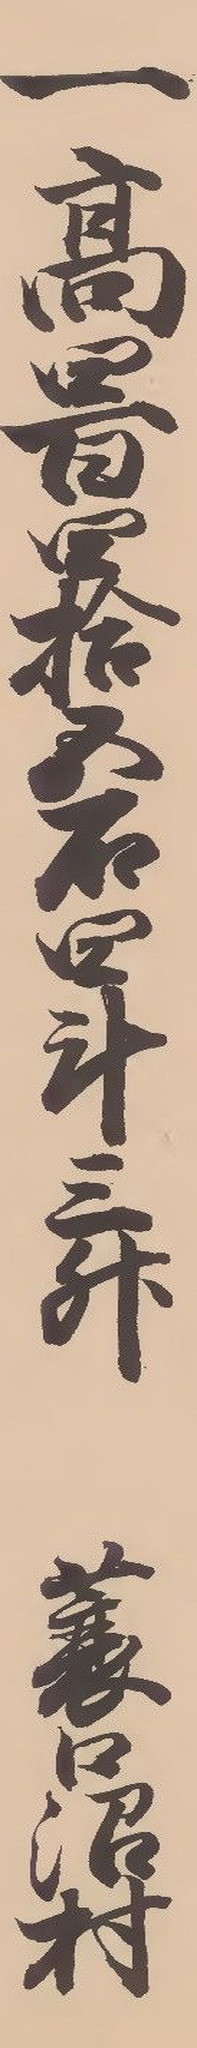一高四百四拾五石四斗三升蓑口沼村
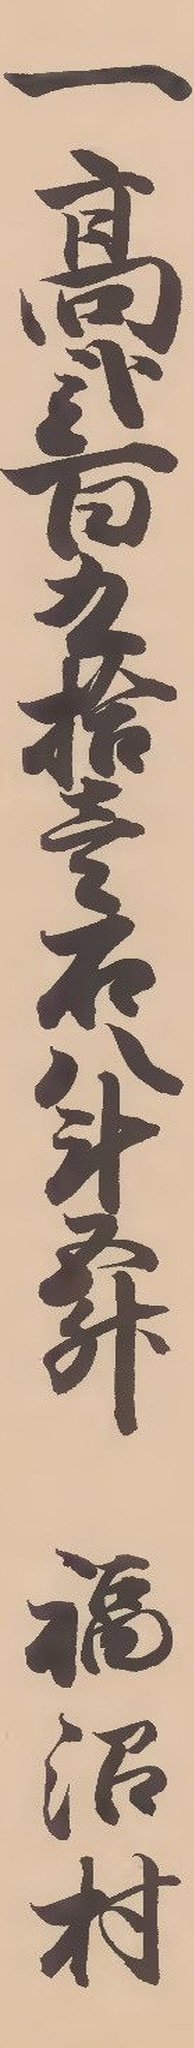一高弐百九拾壱石八斗五升福沼村
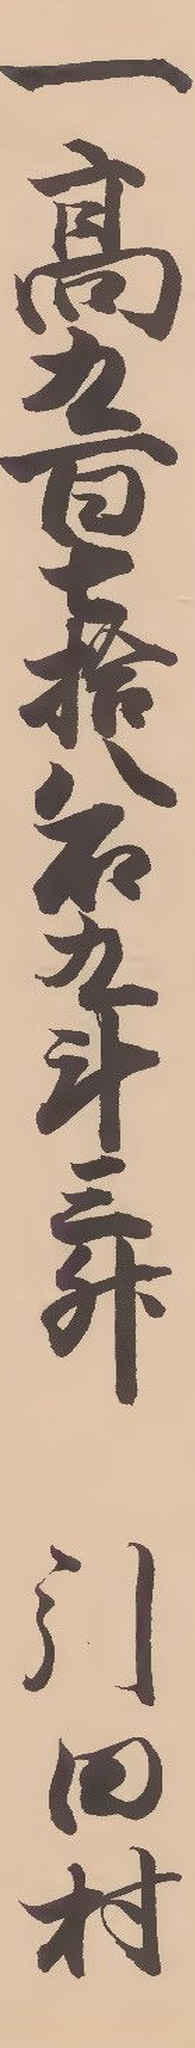一高九百七拾八石九斗三升引田村

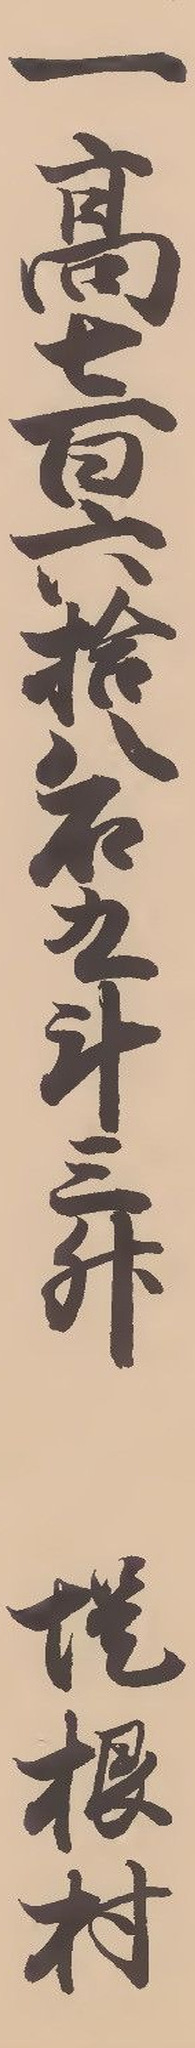一高七百六拾八石九斗三升堤根村
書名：陸奥国郷帳　５
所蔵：国立公文書館 National Archives of Japan
